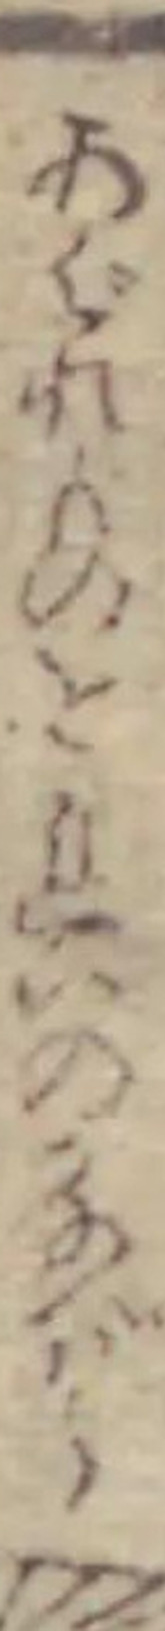あばれものをれいのかなぼう
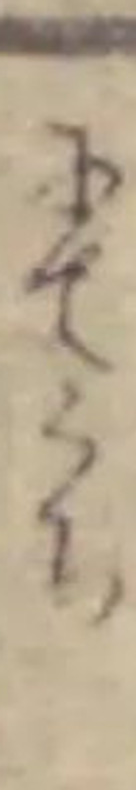にてうち
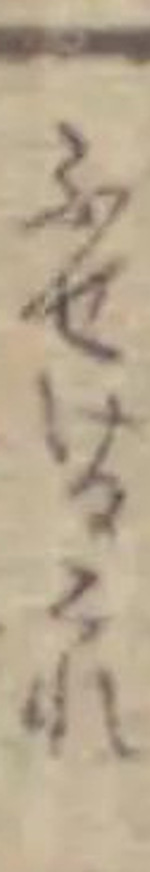ふせけるこれ
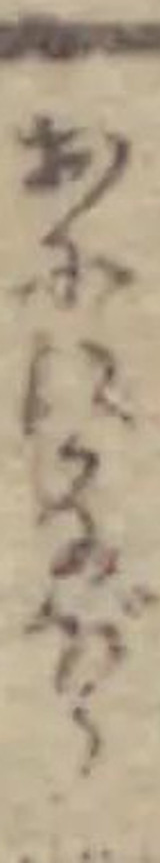おににかなぼう
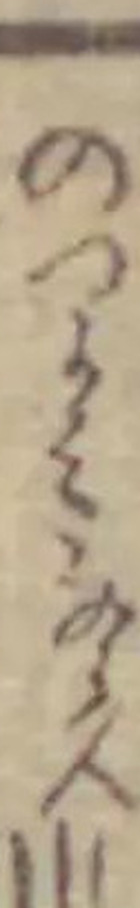のつよみならん

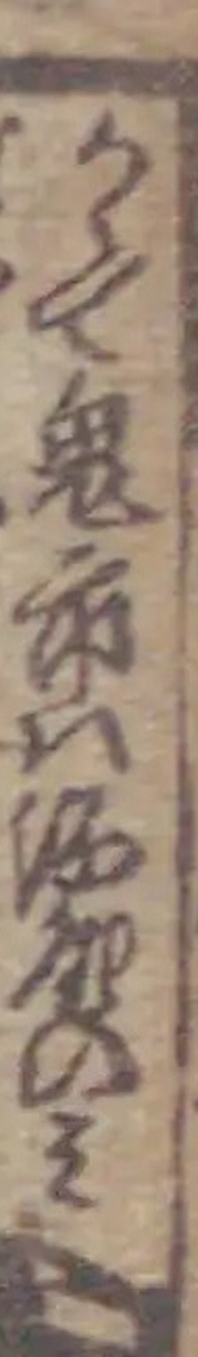かくて鬼市は酒屋のみ
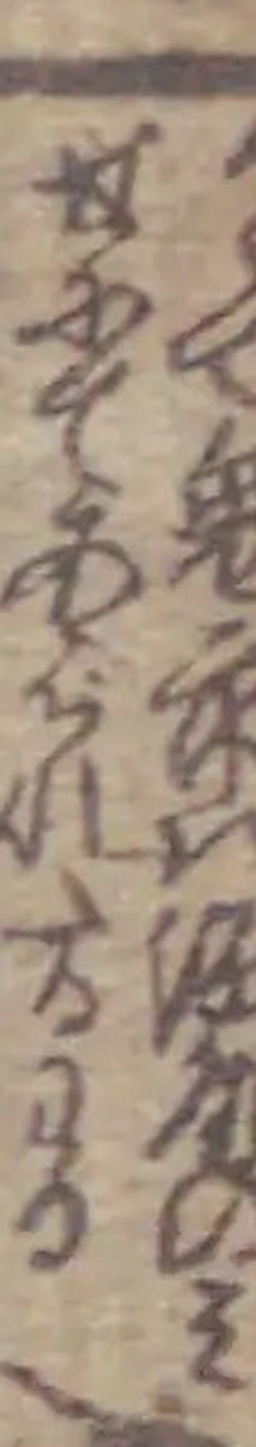せにてあばれたるわる
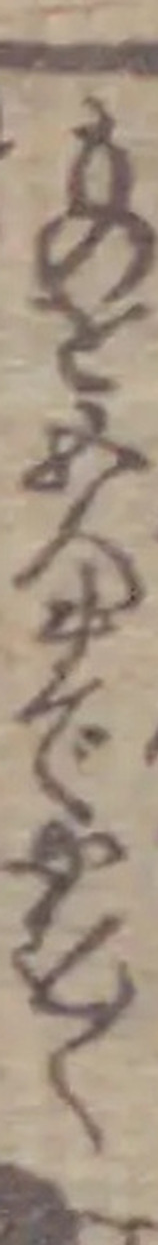ものを五人までやす〳〵
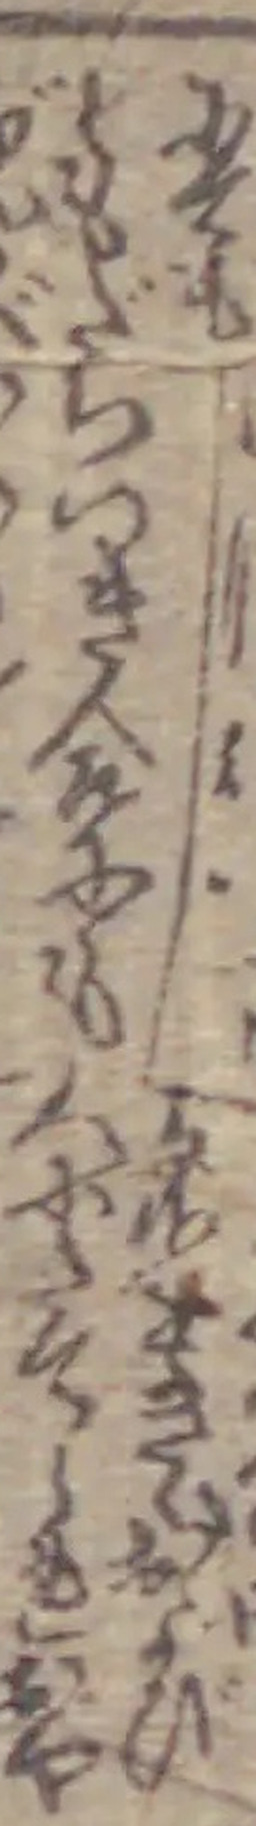ともだちつき合にも人にたてられおや
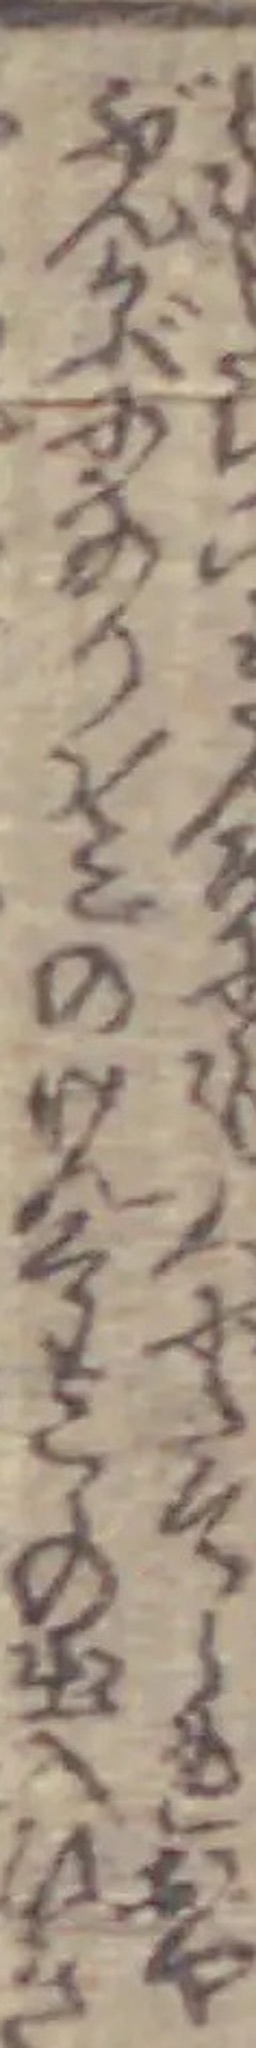ぶんかぶになりそこのけんくわこゝの出入ひき
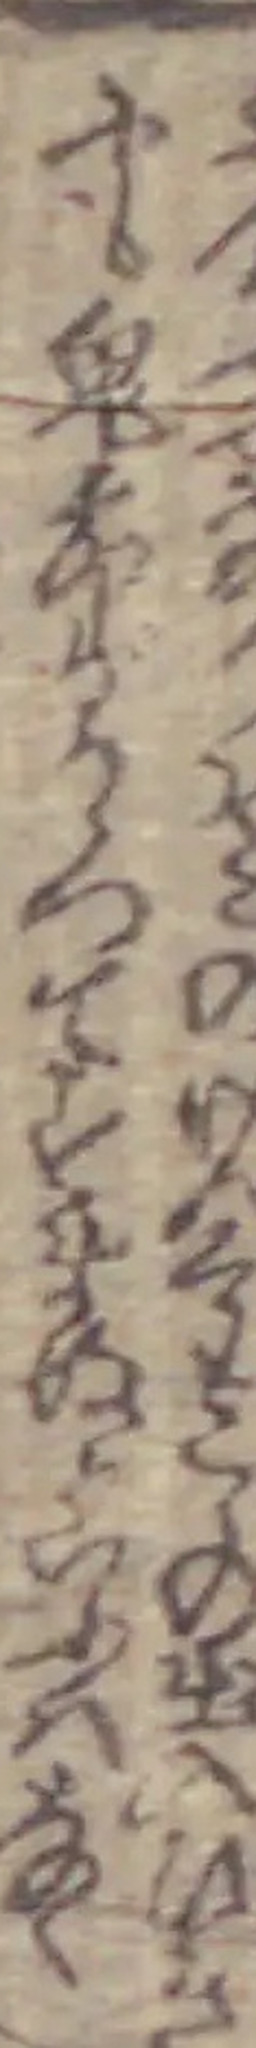にも鬼市がかゝつてすまぬといふはなく
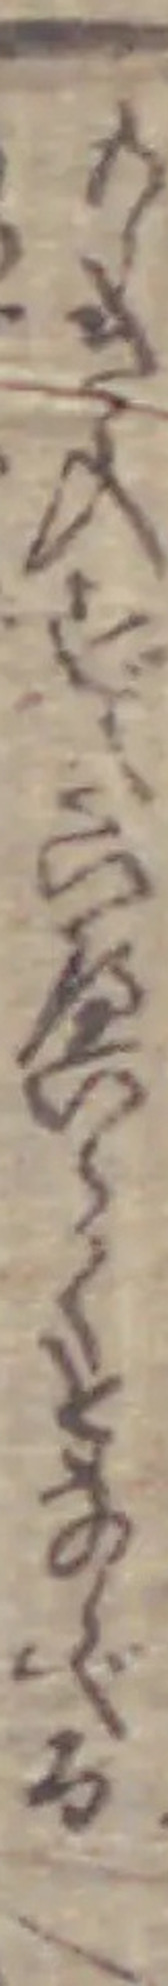もしきゝ入ずたいへいらくをならべる
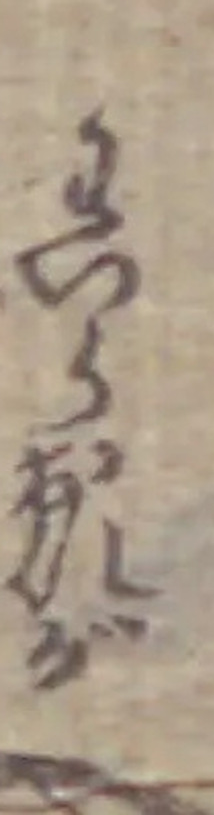わいらおれが
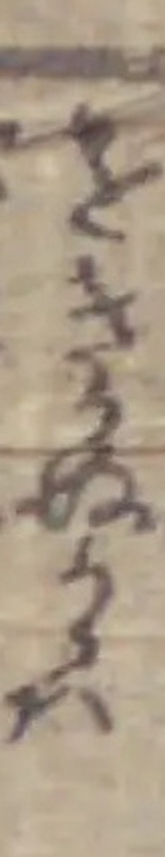をきかぬからは
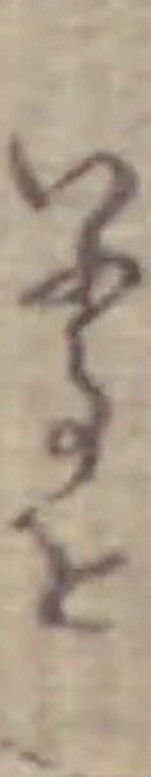いふ事を
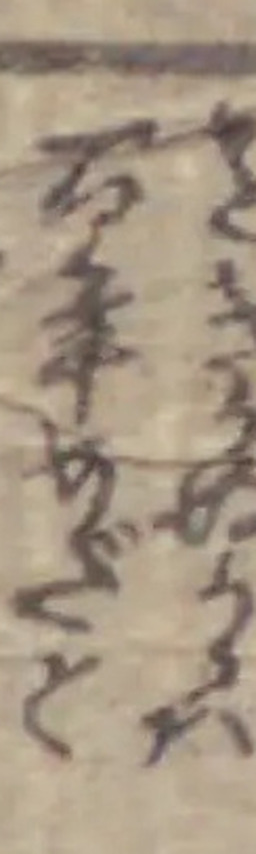百年めだと
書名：鬼子宝 3巻
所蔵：国立国会図書館 National Diet Library, JAPAN
